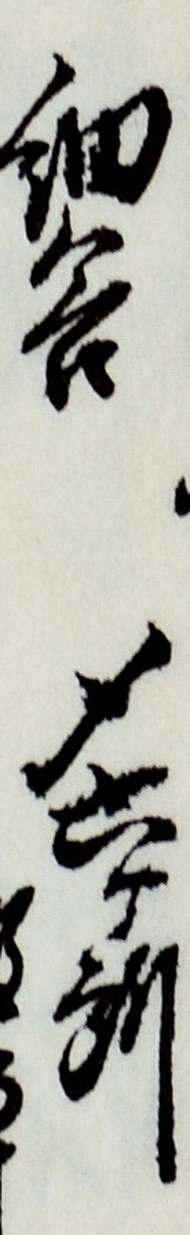細谷〆六ヶ所
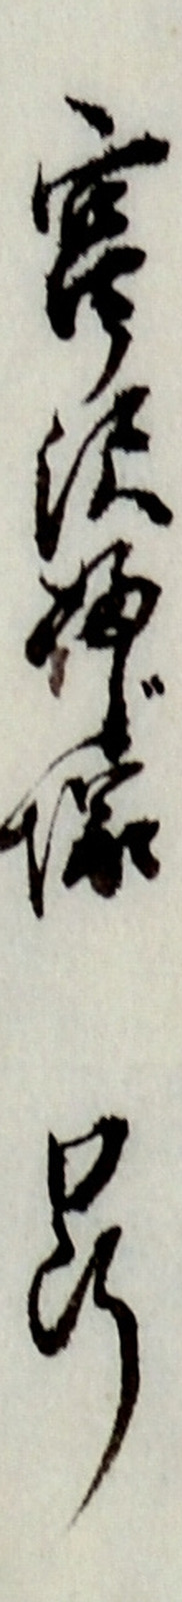宮ノ沢ふじ塚同断

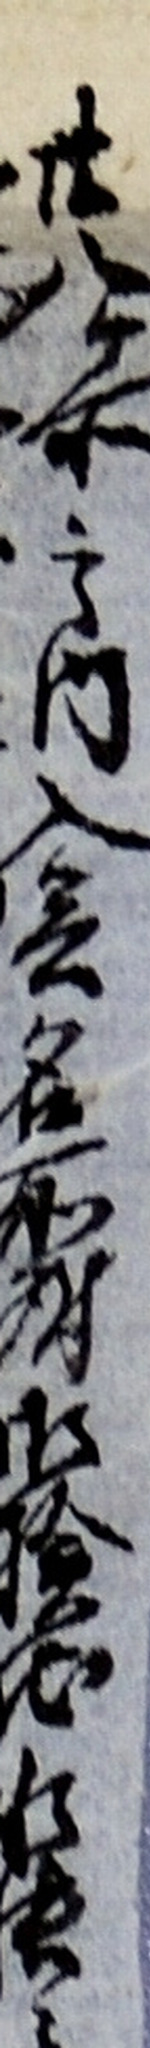廿八ケ所之内入会名前附御検地水帳ニアリ
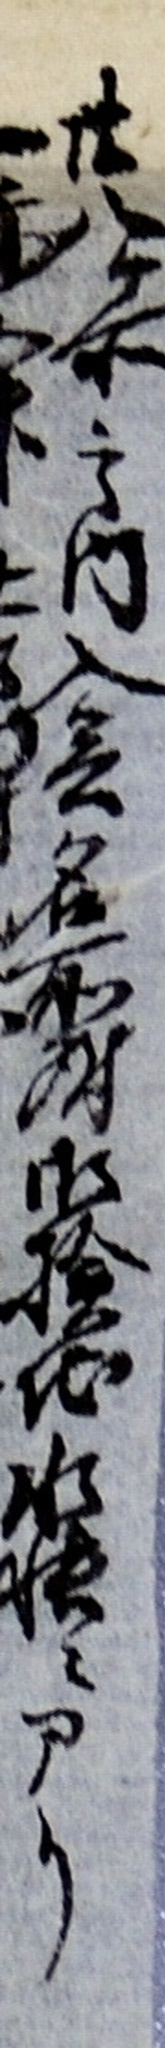廿八ケ所之内入会名前附御検地水帳ニアリ
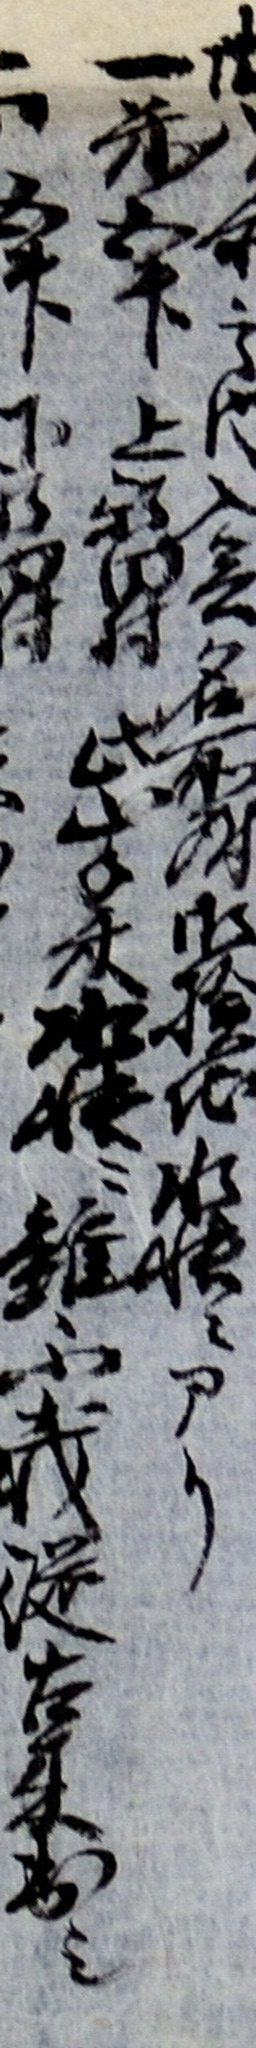一米五升上新田村此山手米水帳ニ雖不載従古来出シ
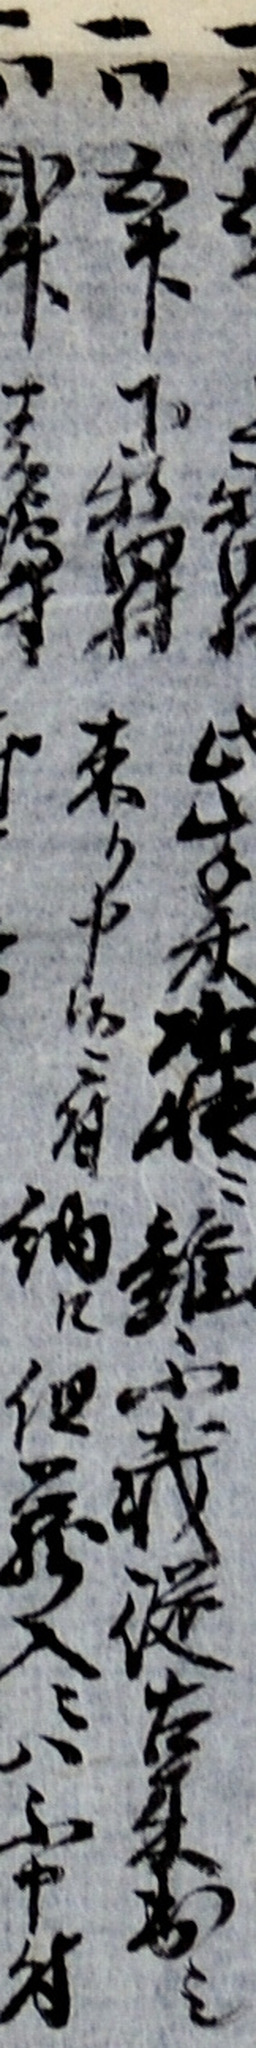一同五升下新田村来リ申候ニ付納ル但蔵入ニハ不申付
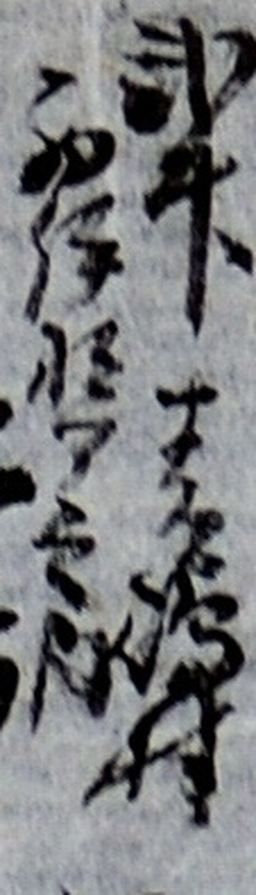西伊那部之内
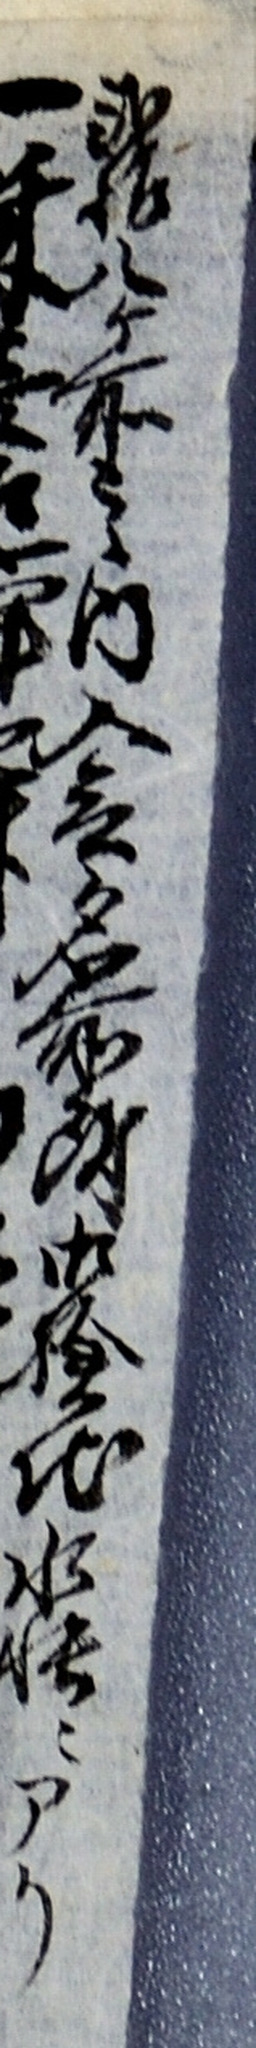弐拾八ケ所之内入会名前附御検地水帳ニアリ
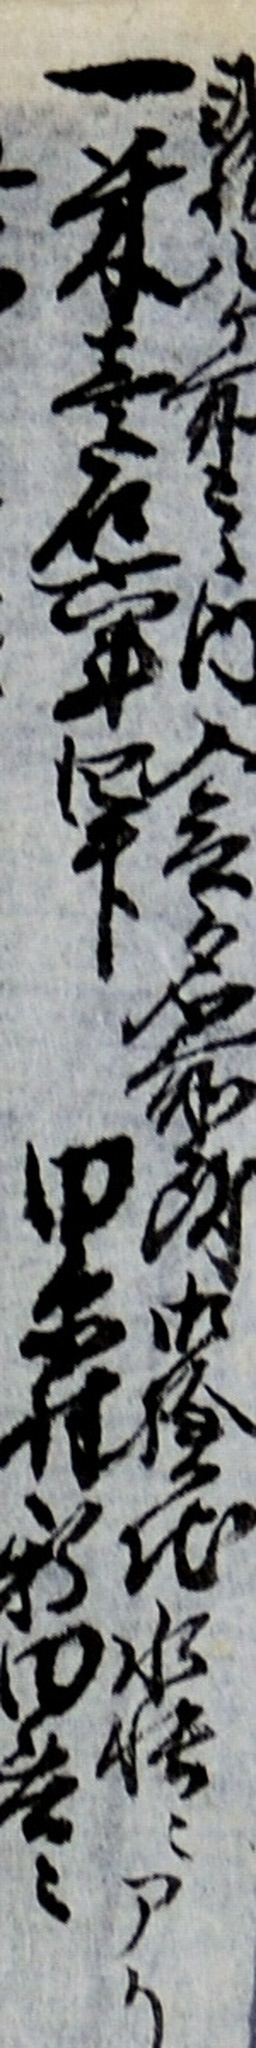一米壱石六斗四升田原村新田共ニ
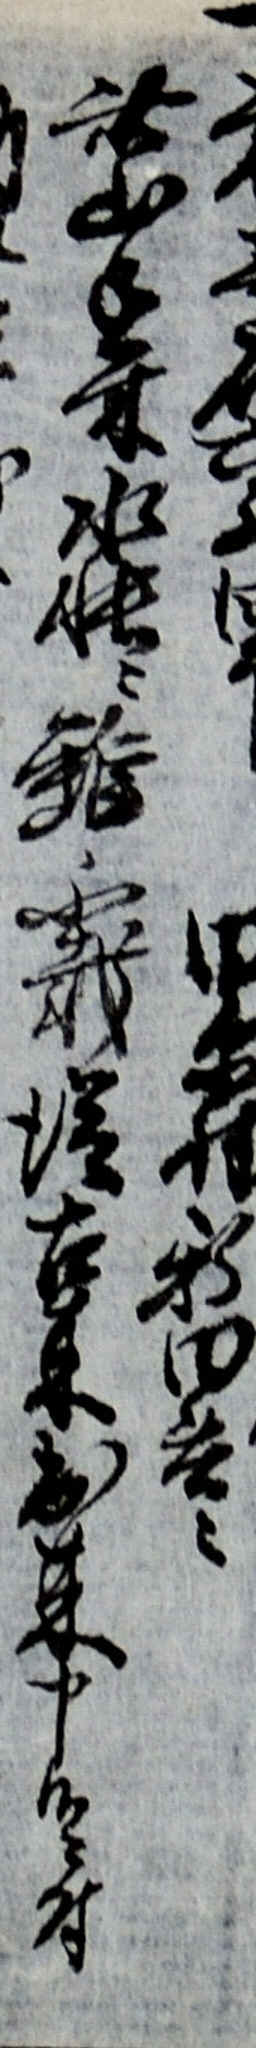此山手米水帳ニ雖不載従古来出来申候ニ付
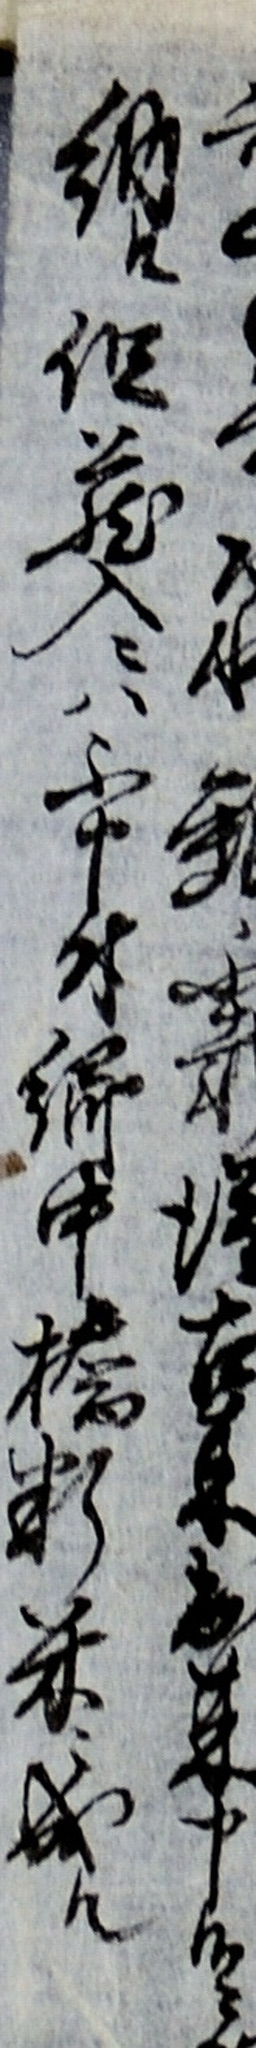納ル但蔵入ニハ不申付郷中橋料米ニ成ル

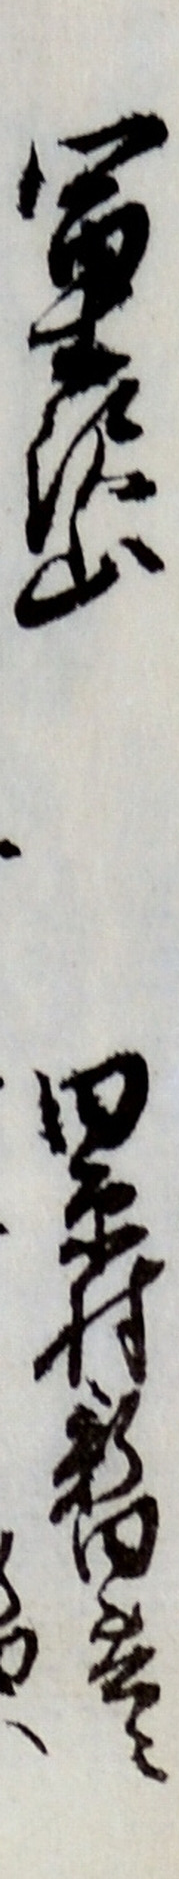富士沢山田原村新田共ニ
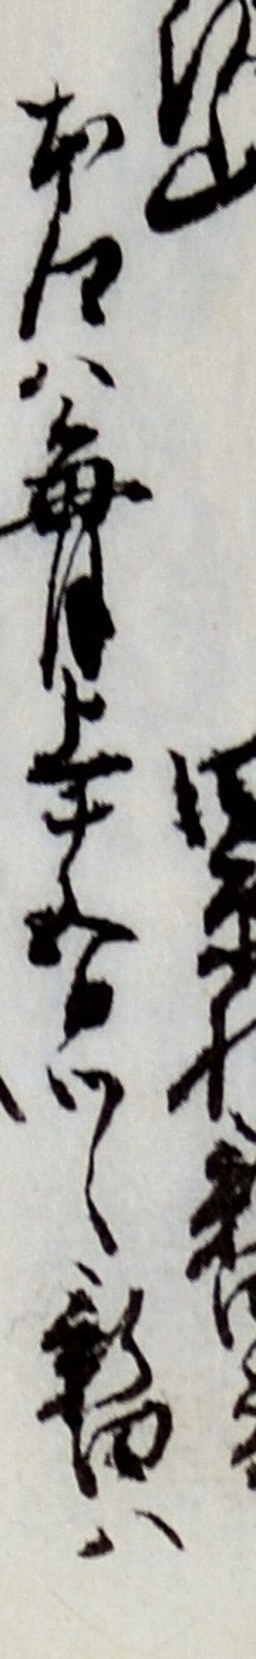本郷ハ毎月上十五日ツヽ新田ハ
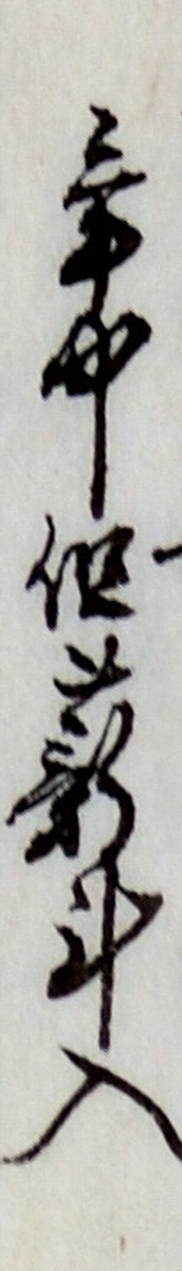年中但薪計入
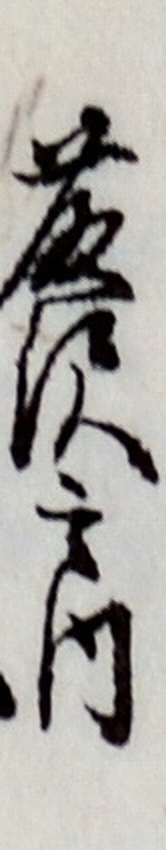藤沢ノ内
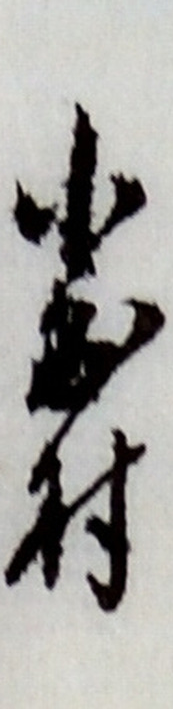小出村
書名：御領分中山林社地手控
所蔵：伊那市立高遠町図書館・合同会社AMANE
